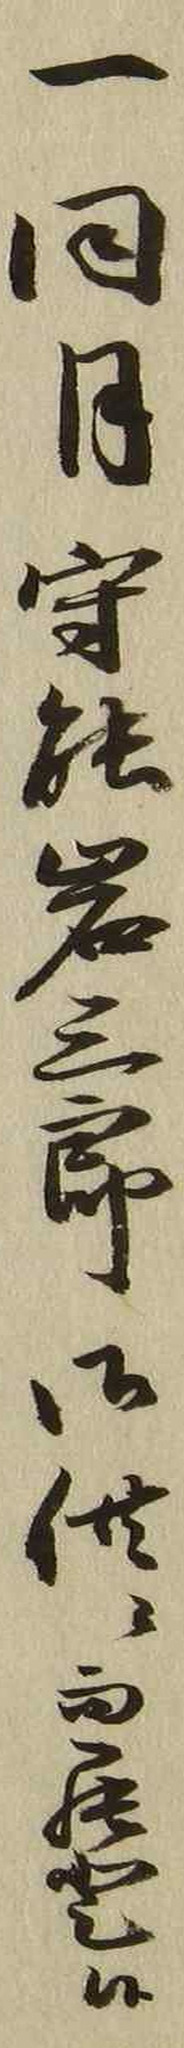一同月守能岩三郎御供ニ而罷登候
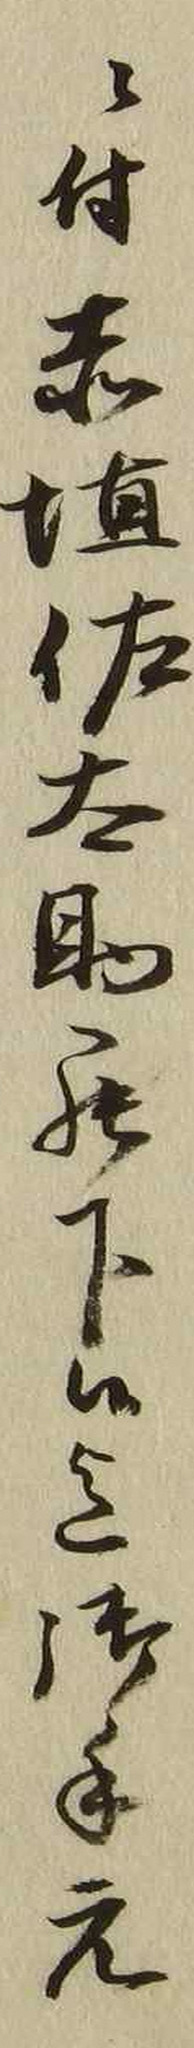ニ付赤植佐太助罷下候迄御手元
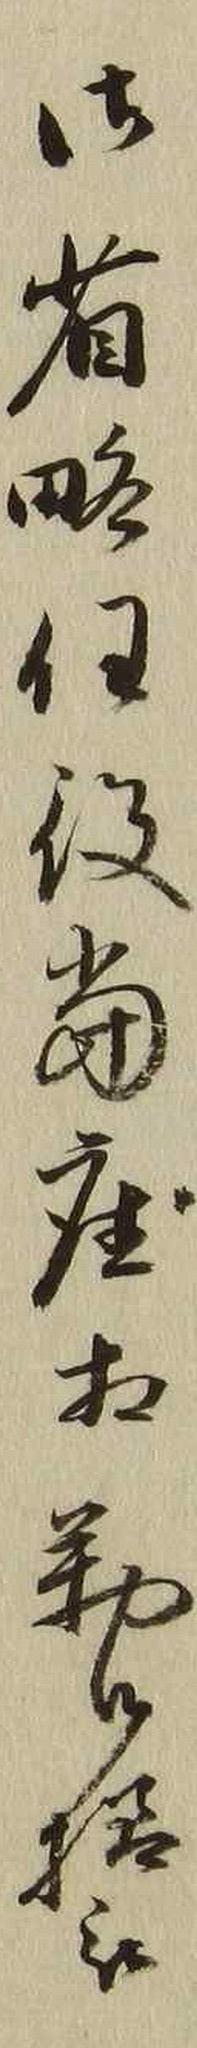御省略任役当座相勤候様被
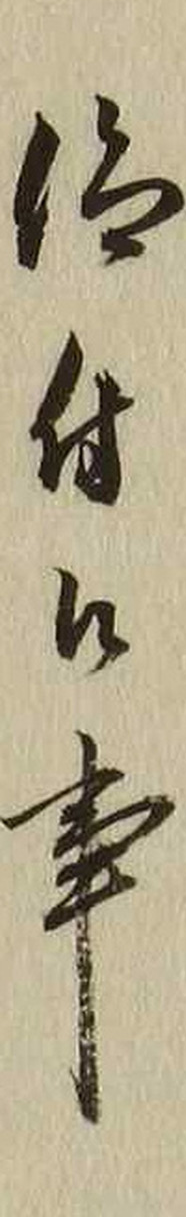仰付候事
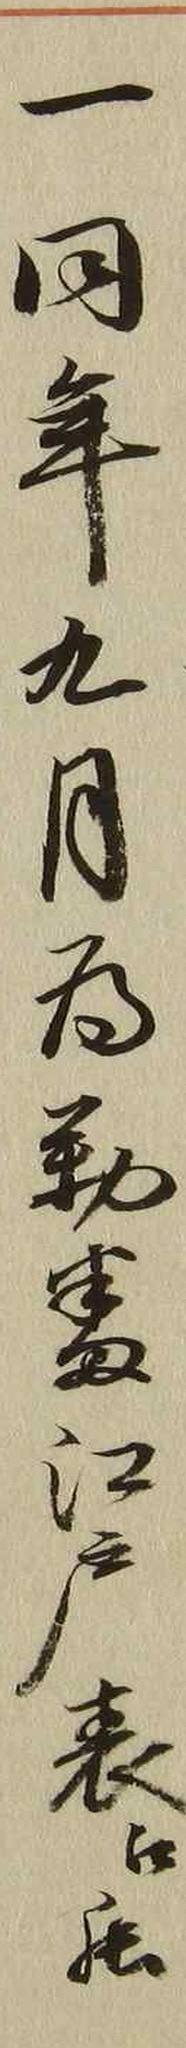一同年九月為勤番江戸表江罷
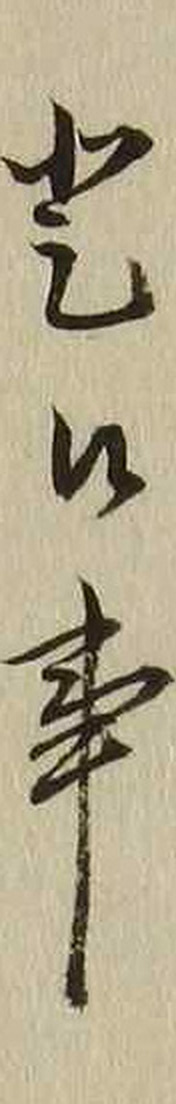登候事
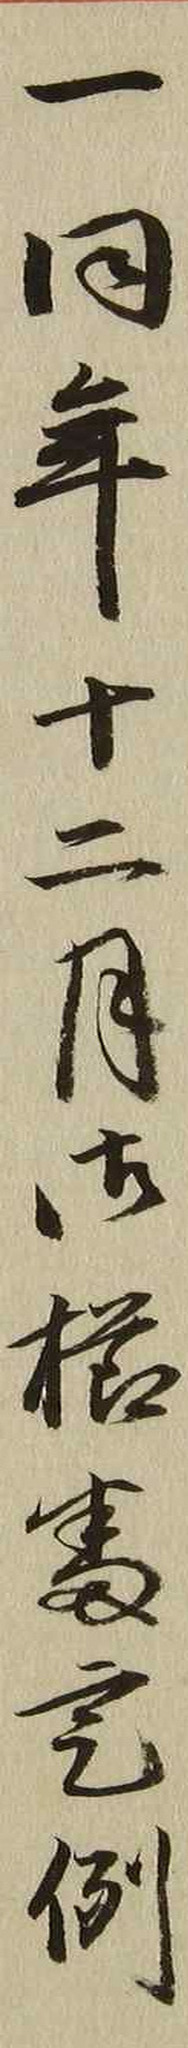一同年十二月御櫛番定例
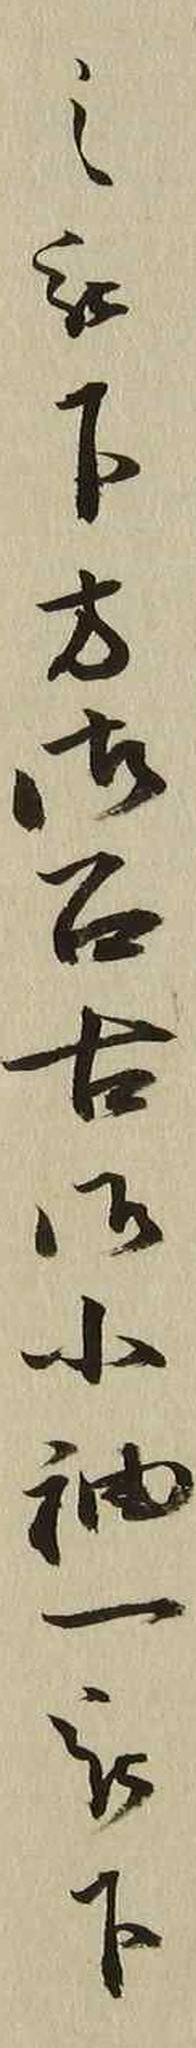之被下方御召古御小袖一被下
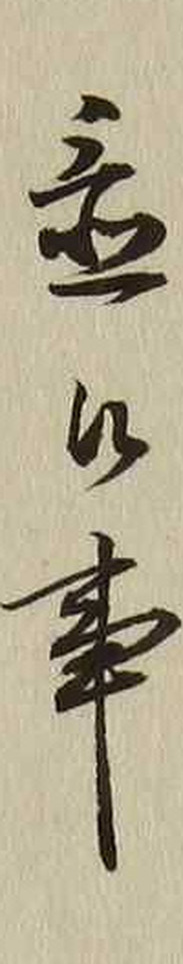置候事
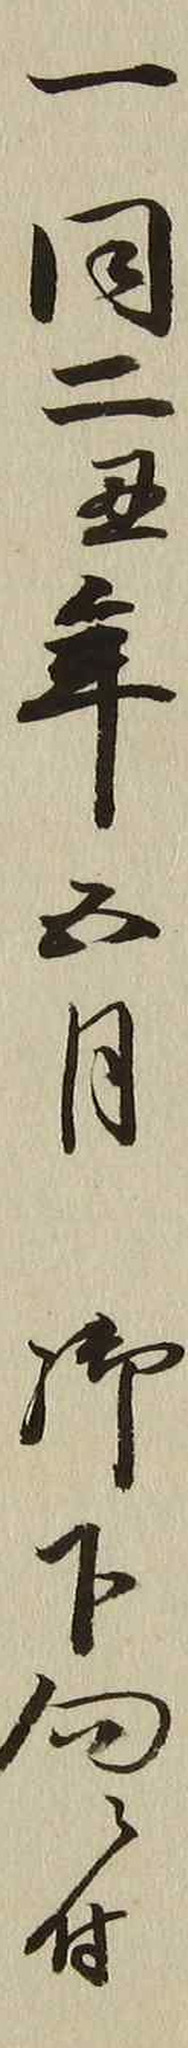一同二丑年五月御下向ニ付
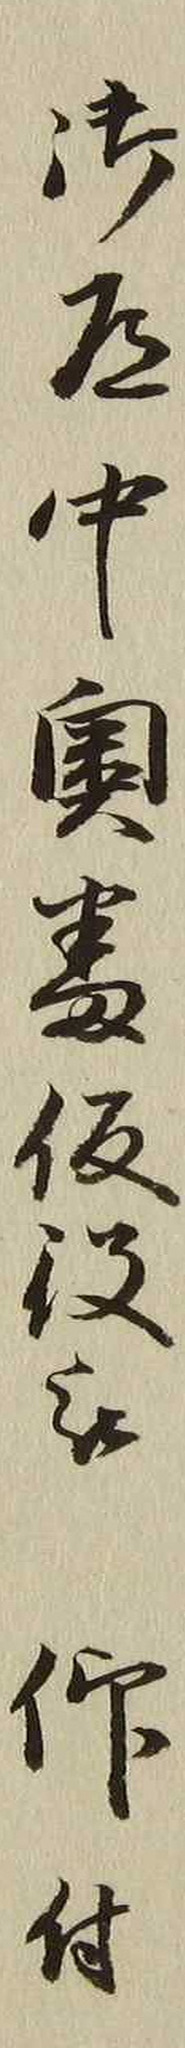御道中奥番仮役被仰付
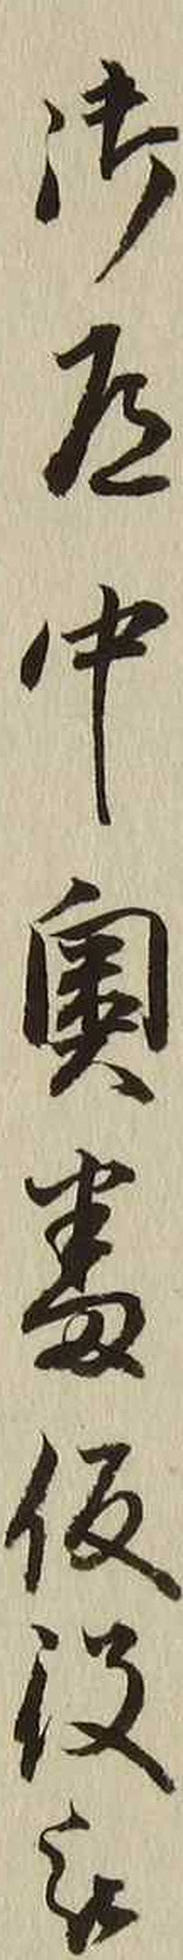御道中奥番仮役被仰付
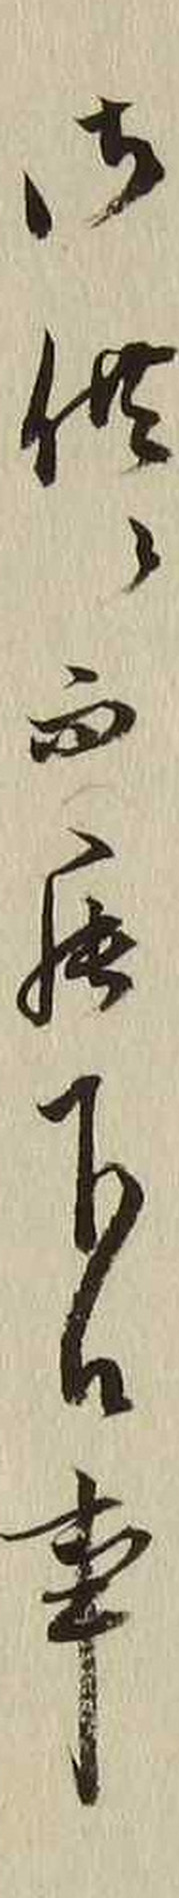御供ニ而罷下候事
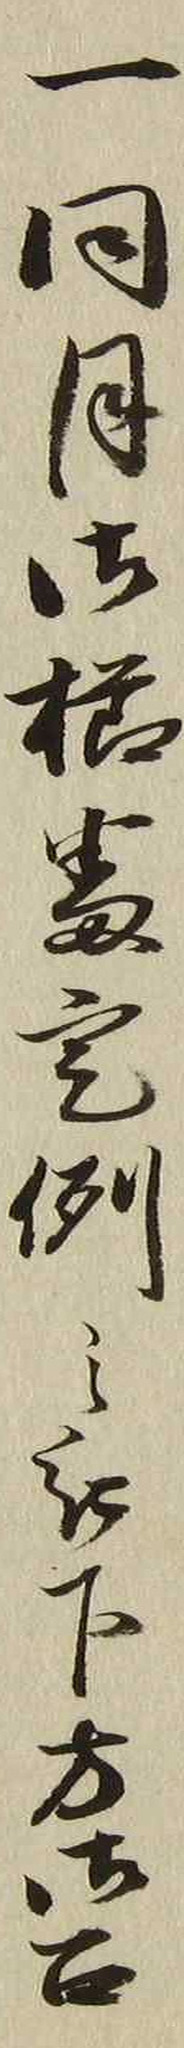一同月御櫛番定例之被下方御召
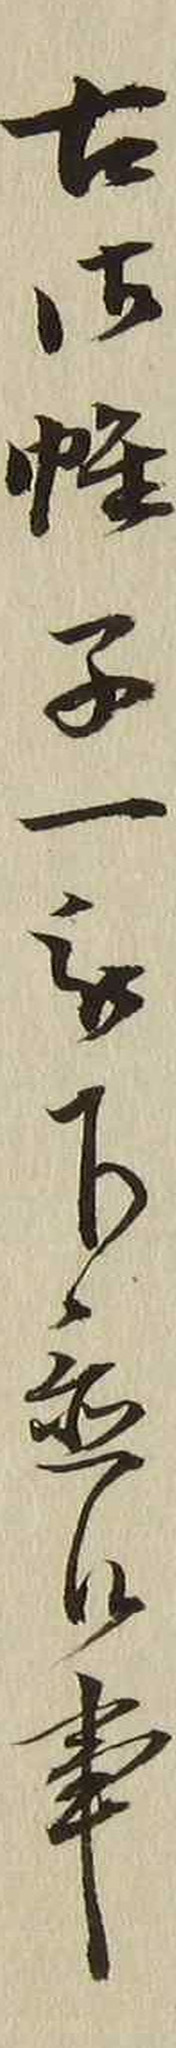古御帷子一被下置候事
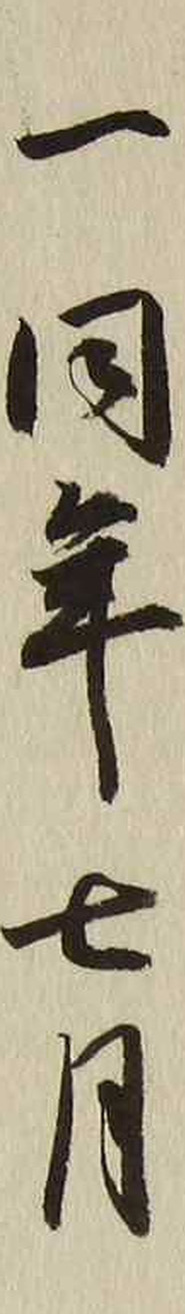一同年七月
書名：諸士系譜　巻之61　と之部4
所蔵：会津若松市立会津図書館
